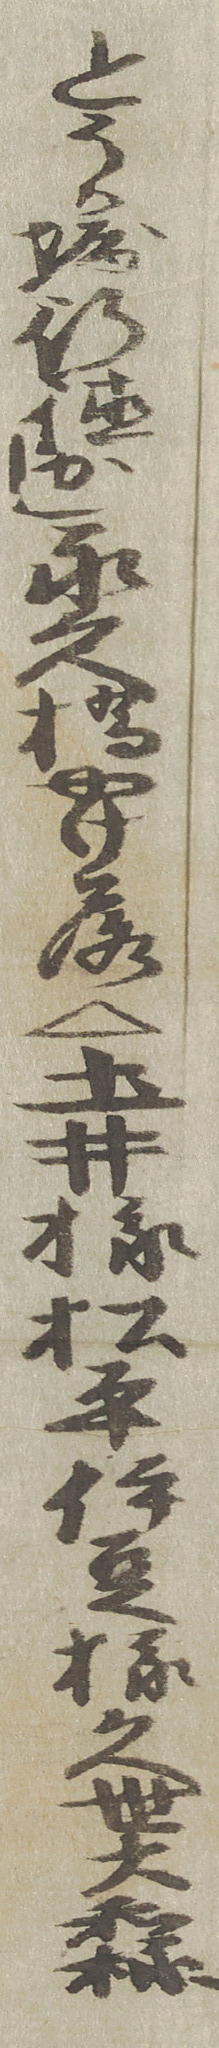とうけ堀行徳かし永久橋やけ落△土井様松平伊豆様久世大和様
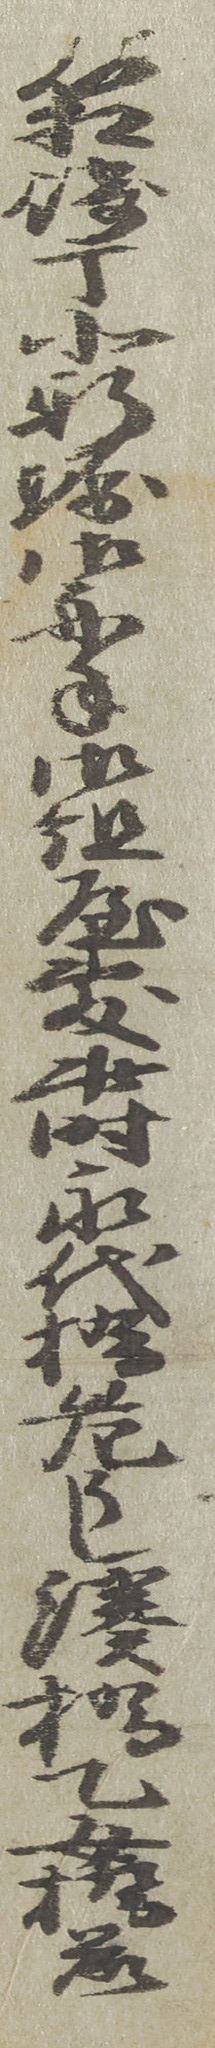箱崎丁北新堀御舟手御組屋敷此時永代橋危うし湊橋乙女橋落
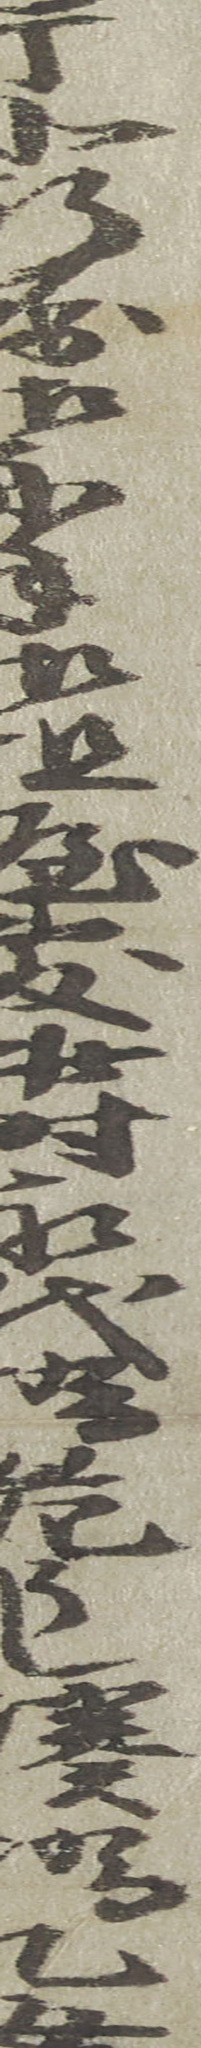箱崎丁北新堀御舟手御組屋敷此時永代橋危うし湊橋乙女橋落
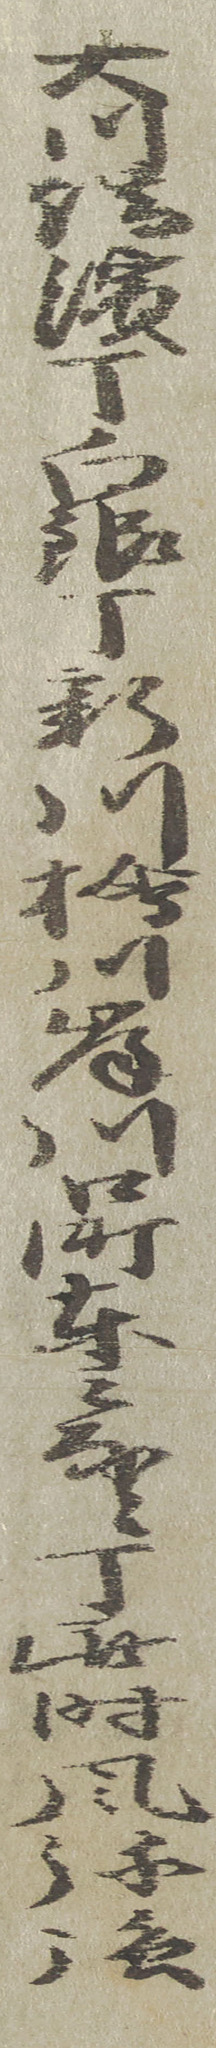大川端濱丁白銀町新川檜川岸川口町東ミなと丁此時風弥強
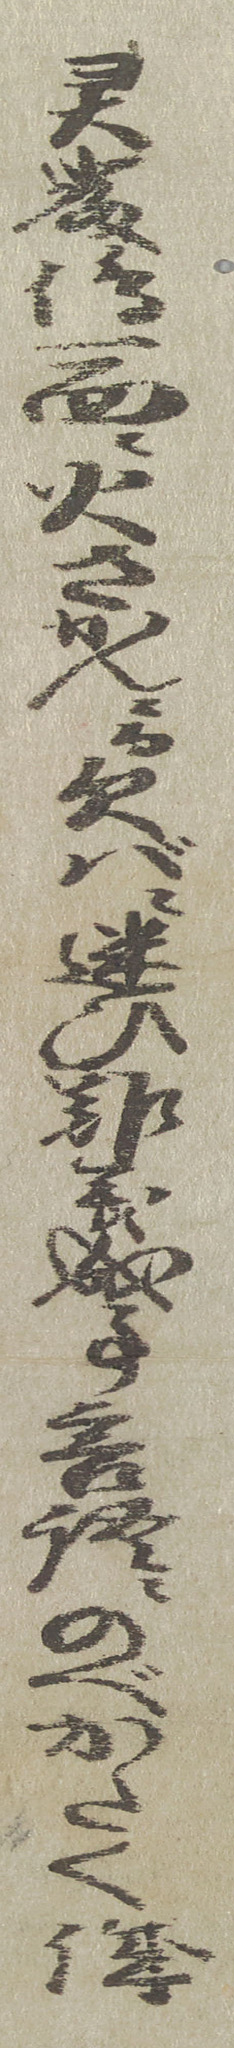霊巌嶋一面ニ火さかんニ而欠バニ迷ひ難義成事言語ニのべがたく誠
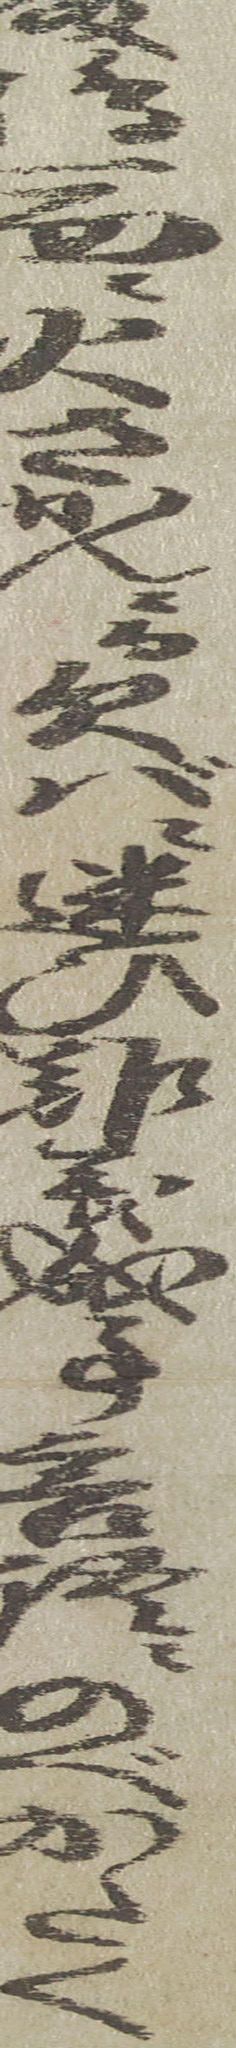霊巌嶋一面ニ火さかんニ而欠バニ迷ひ難義成事言語ニのべがたく誠
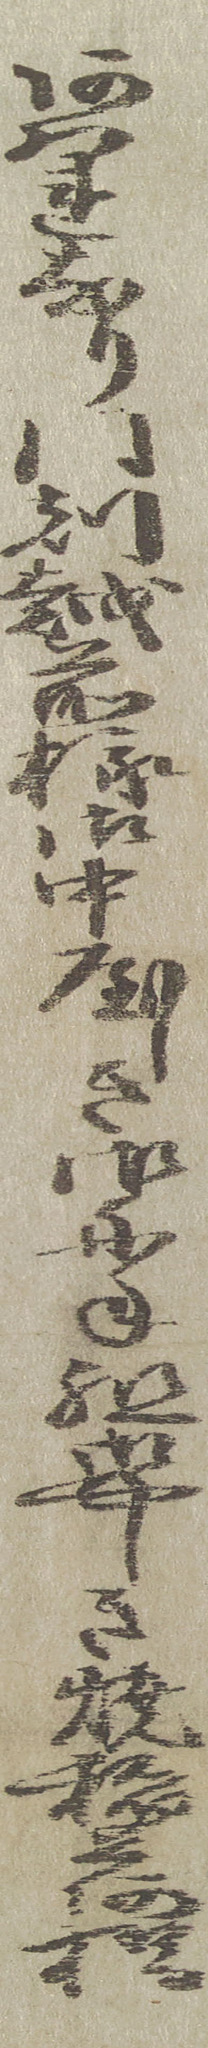あハれなり同刻越前様御中屋しき御舟手組御やしき焼稲荷橋
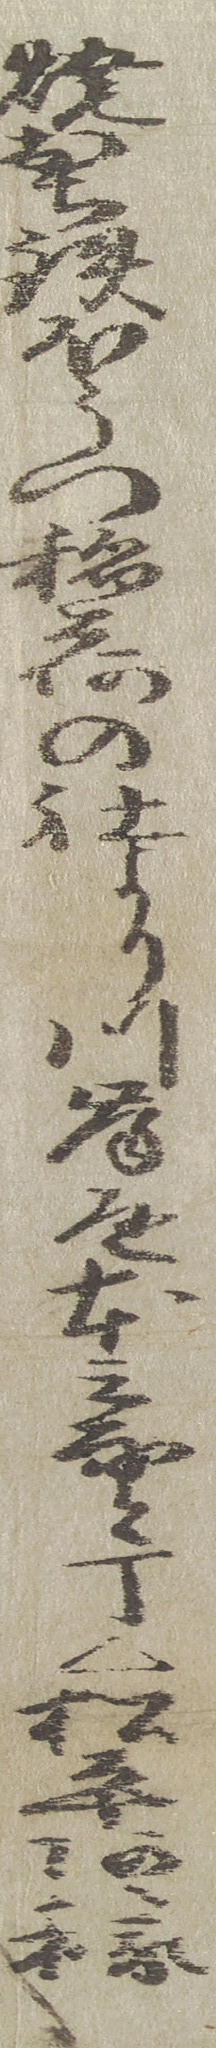焼おち鉄ほうつ稲荷の社より川岸通本ミなと丁△松平阿ハ様
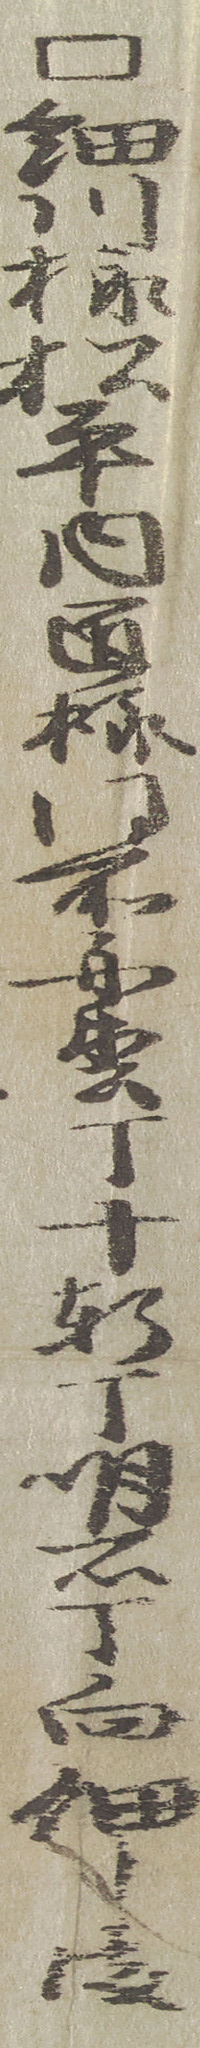細川様松平内匠様同所舟松丁十軒丁明石丁向佃しま
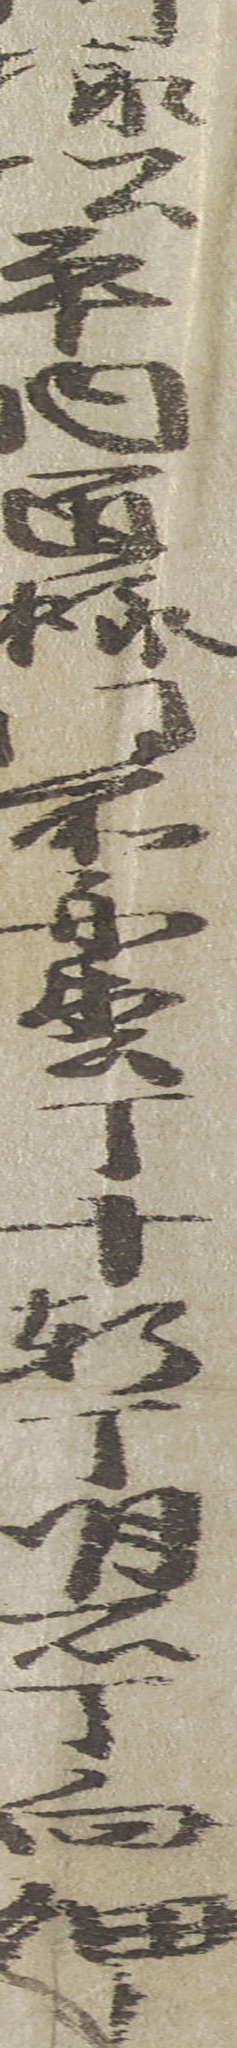細川様松平内匠様同所舟松丁十軒丁明石丁向佃しま
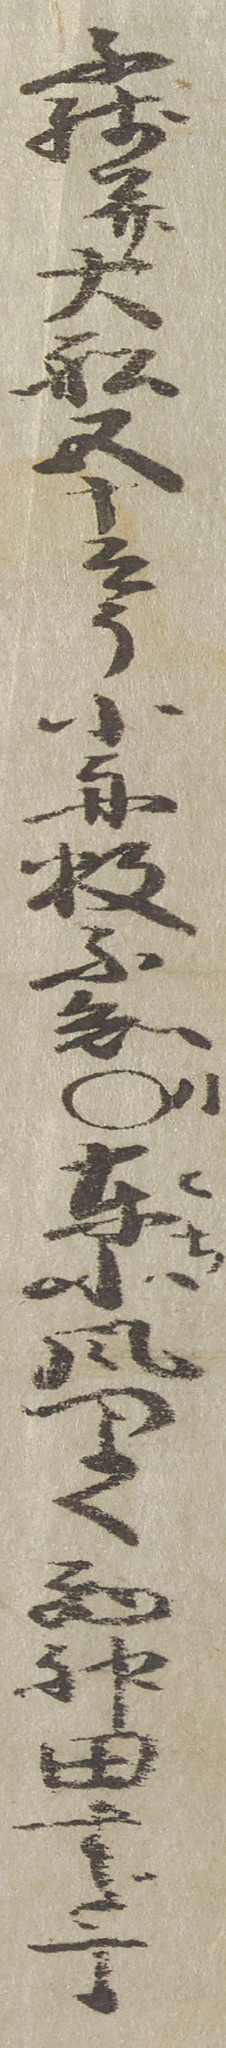不残并大船五十そう小舟数不知◯東北風つよく西神田すだ丁
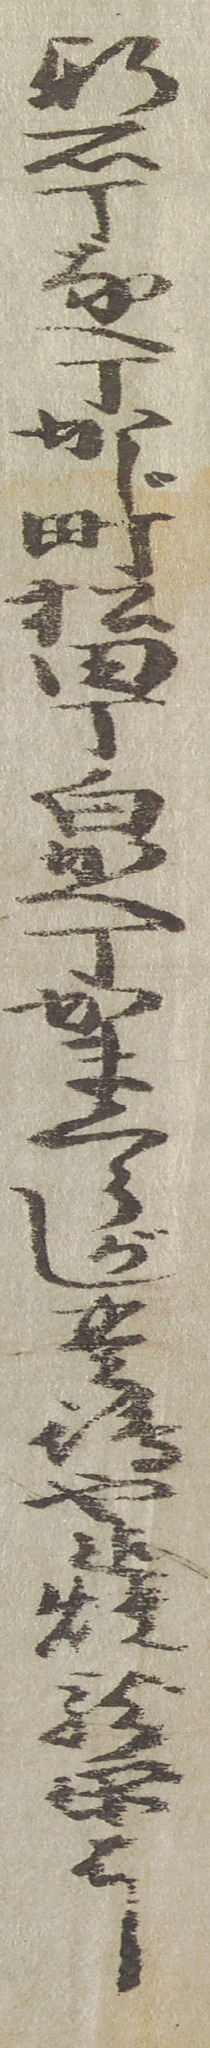新石丁なへ丁かじ町松田丁白かへ丁かまくらがし豊嶋や迄焼龍閑はし
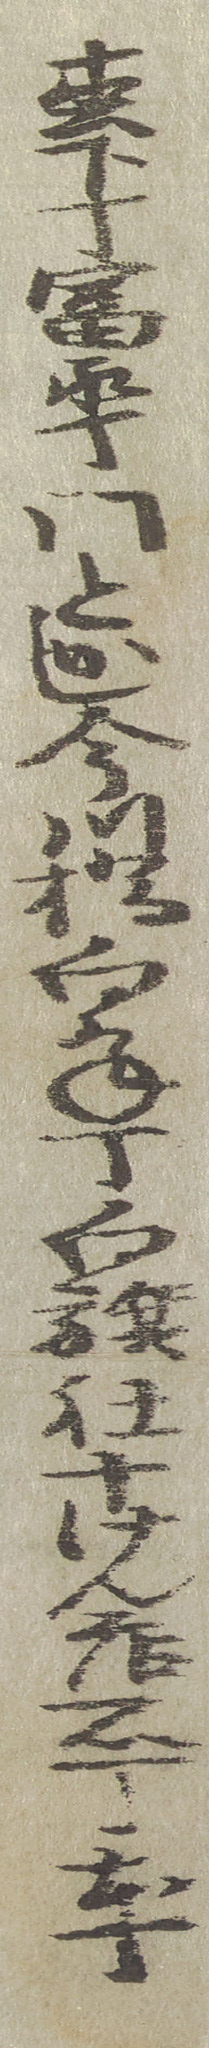松下丁富永丁同とかし今川橋白かね丁白旗社十けん店石丁甚丁
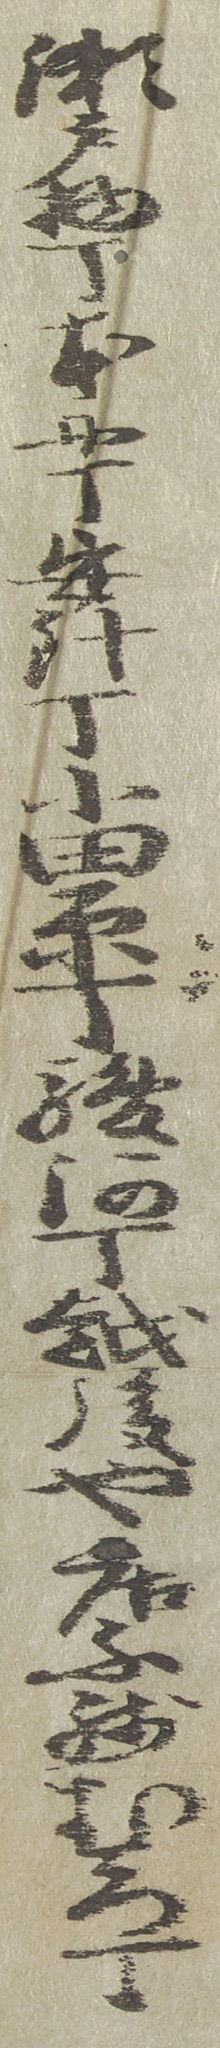瀬戸物丁本舟丁安針丁小田原丁駿河丁越後や店不残むろ丁
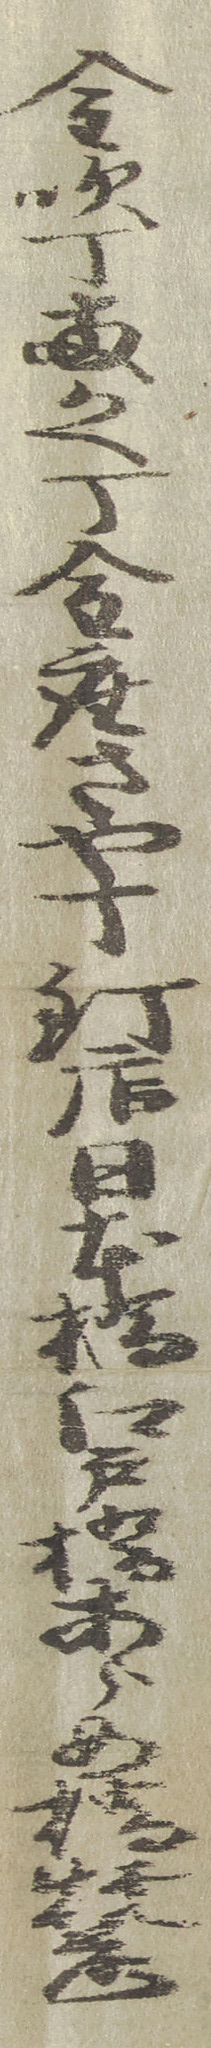金吹丁両かへ丁金座さや丁釘店日本橋江戸橋あらめ橋焼落
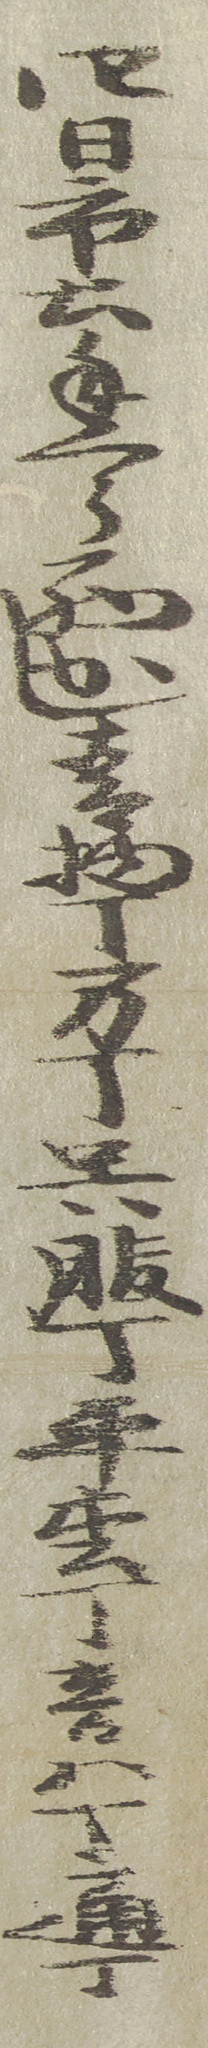四日市土手くら西かし青物丁万丁呉服丁平松丁音ハ丁通丁
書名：方角場所附 [江戸大火]
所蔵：東京大学総合図書館 General Library in the University of Tokyo, JAPAN
